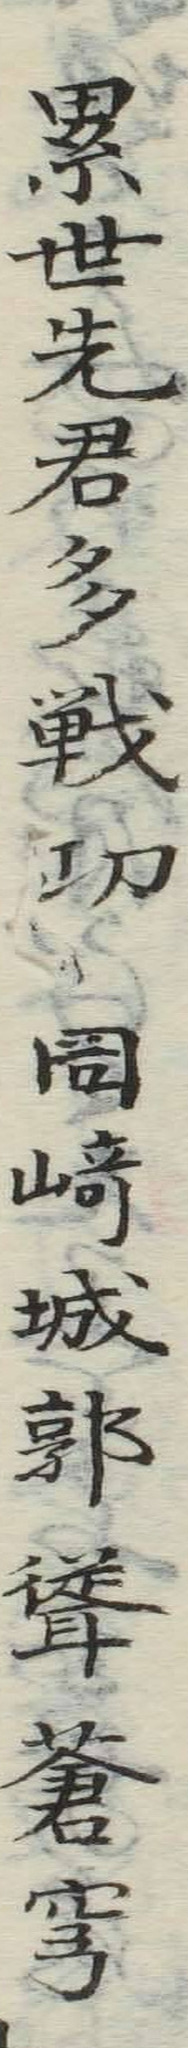累世先君多戦功岡崎城郭聳蒼穹
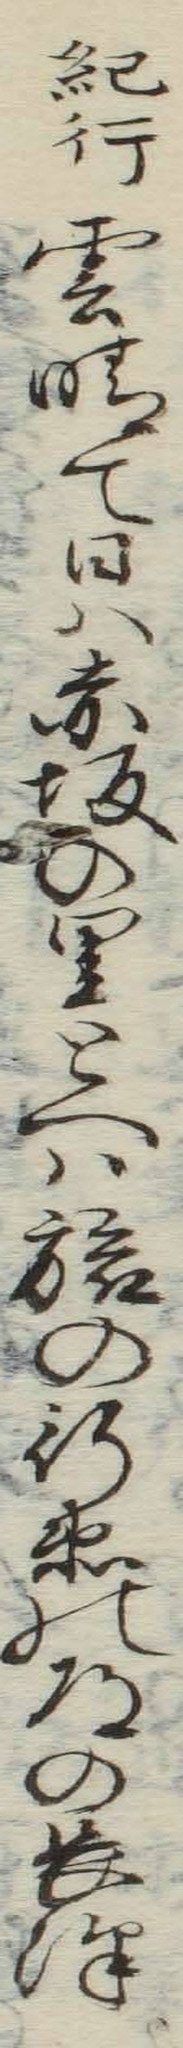紀行雲晴て日は赤坂の里とへは旅の行ゑの道の長沢小堀宗甫
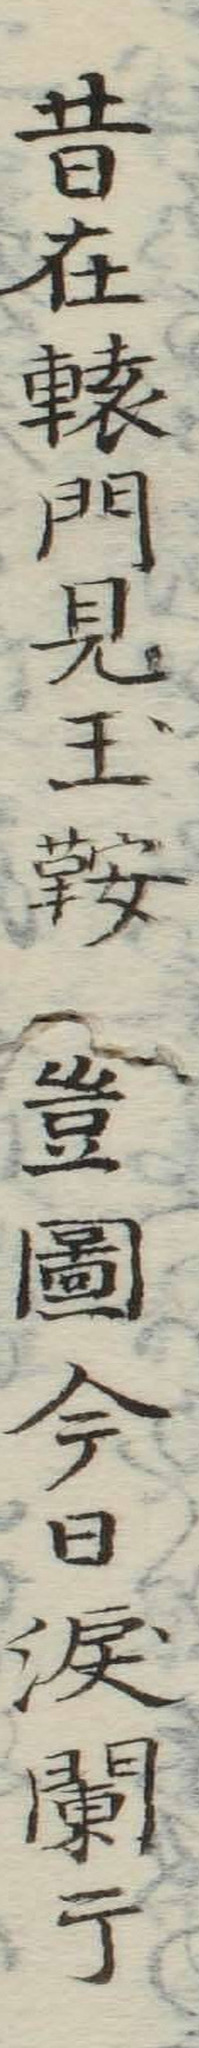昔在轅門見玉鞍豈図今日涙闌干

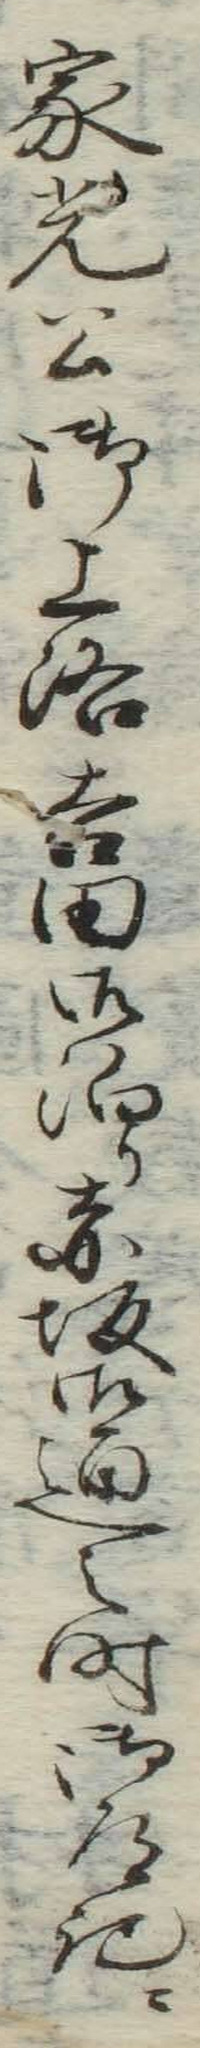家光公御上洛吉田御泊り赤坂御通の時御道記に
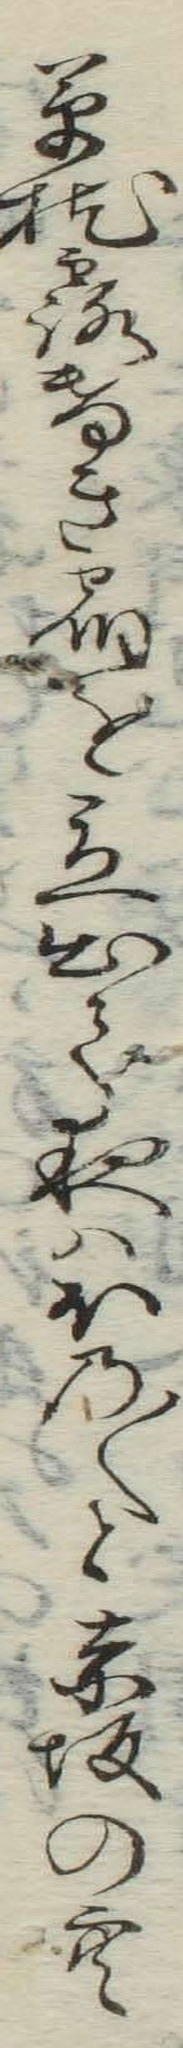草枕露けき宿を立出て夜はほの〳〵と赤坂の空
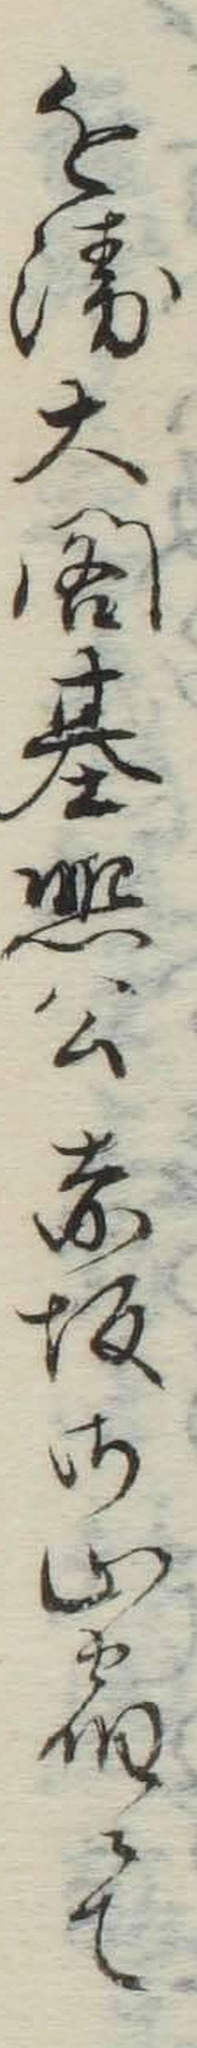近衛太閤基熙公赤坂御止宿にて
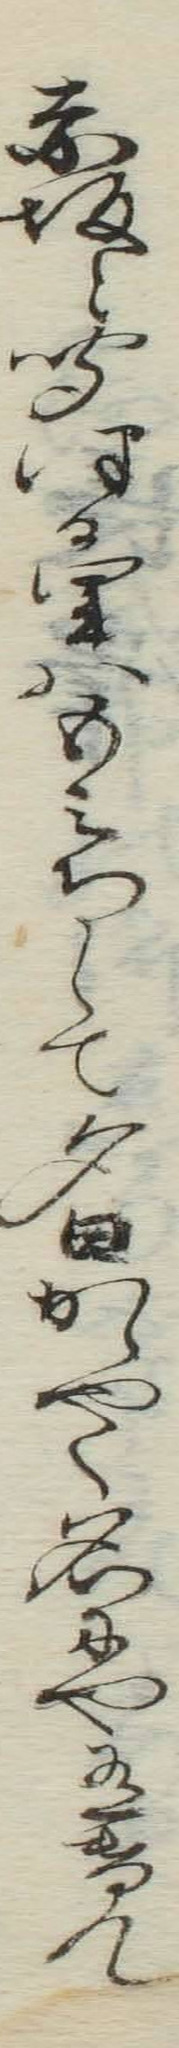赤坂と聞つる里はもみちして夕日かゝやく名にや有けん
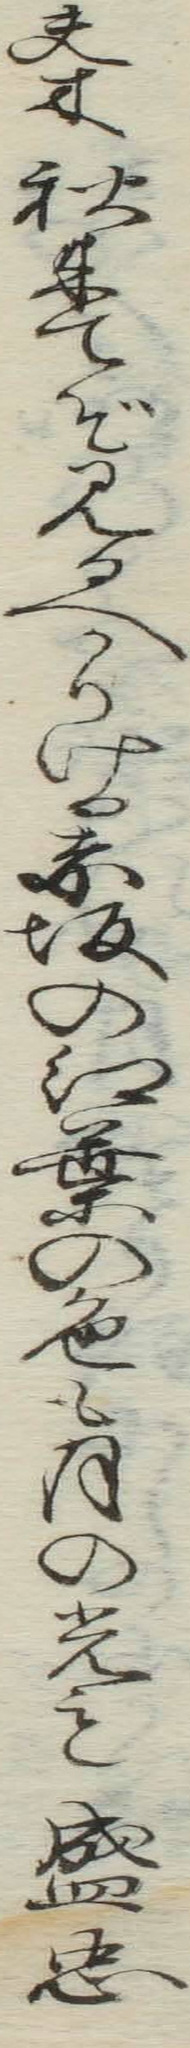夫木秋来てぞ見るへかりける赤坂の紅葉の色も月の光も盛忠
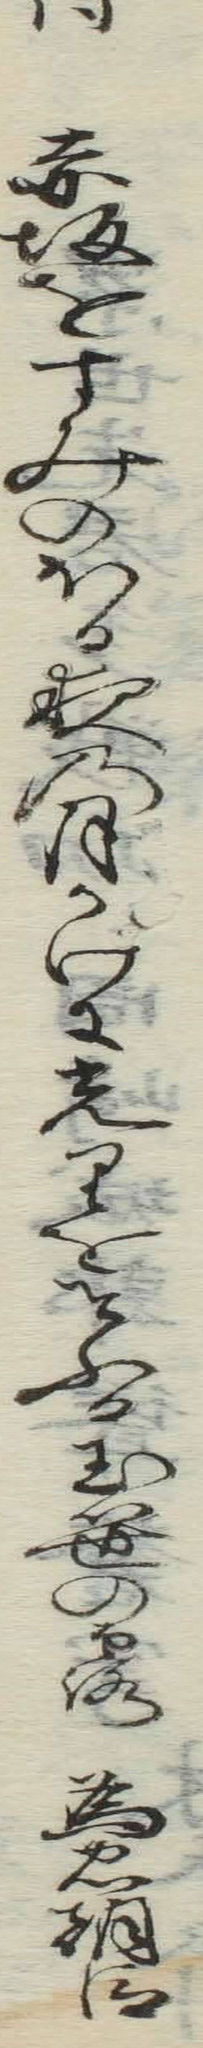同赤坂をすみのほる夜の月かけに光りをそふる玉笹の露為忠朝臣
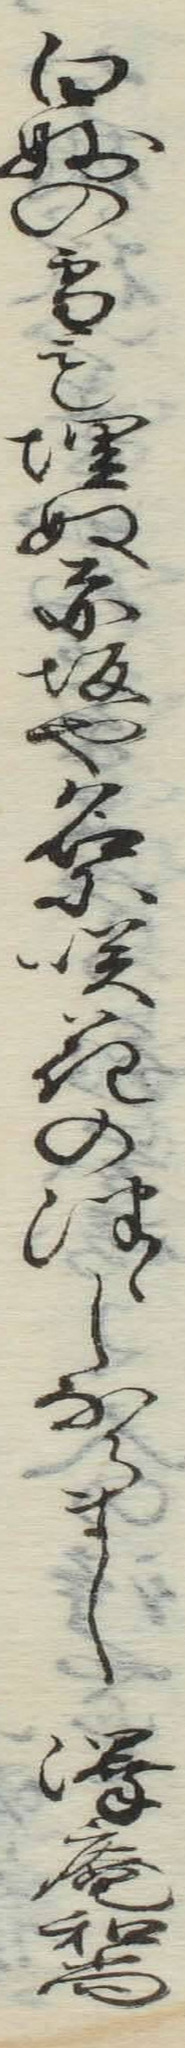白妙の雪も埋ぬ赤坂や名に咲花のつゝしならまし澤庵和尚
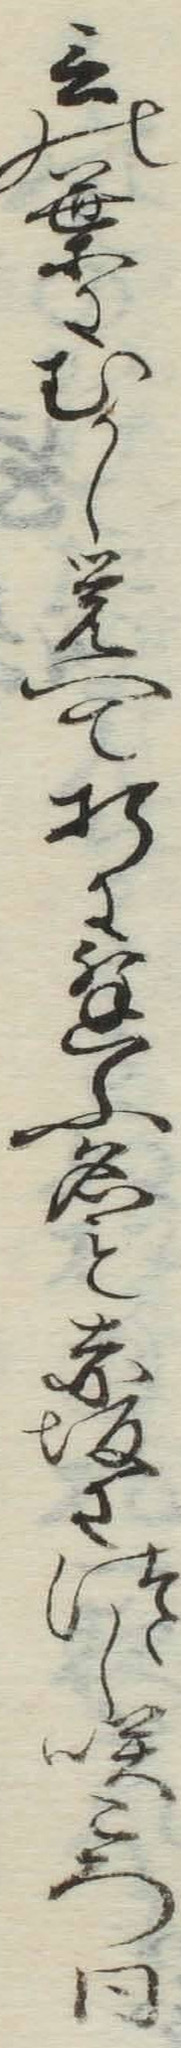言の葉にむかし覚へて折に逢ふ名も赤坂につゝし咲ころ同
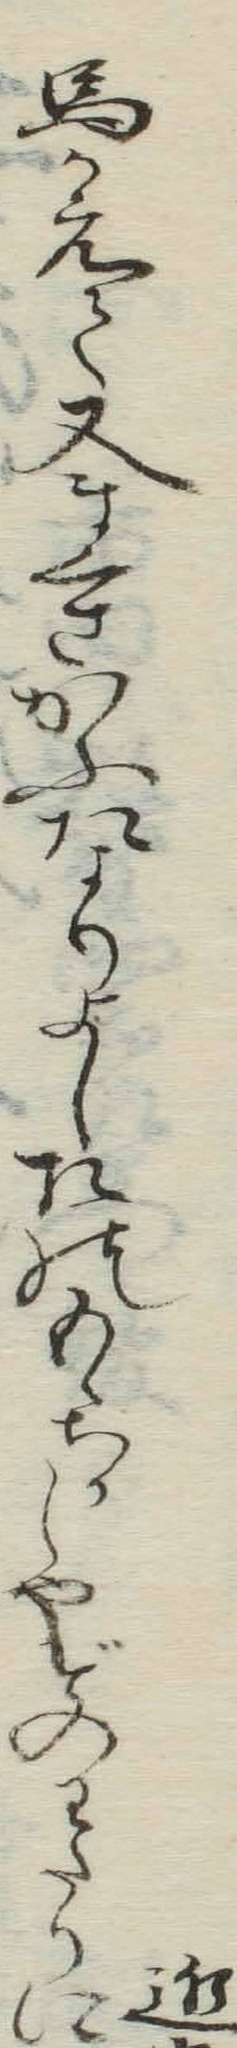馬かえて又まくさかふたよりよしたのもゝちかしやどのわたりに近衛殿三木
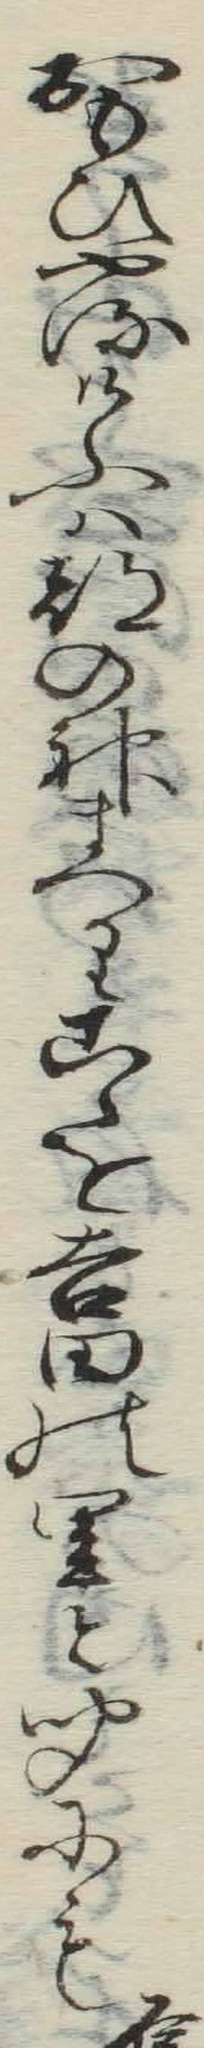おもひやるけふは都の神まつりこゝを吉田の里と聞にも烏丸光広
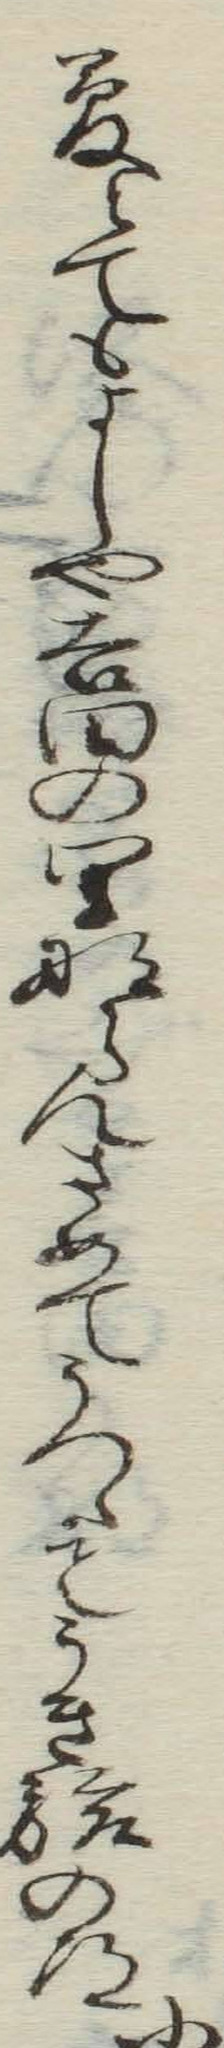夢とてもよしや吉田の里ならんさめてうつゝもうき旅の道小堀宗甫
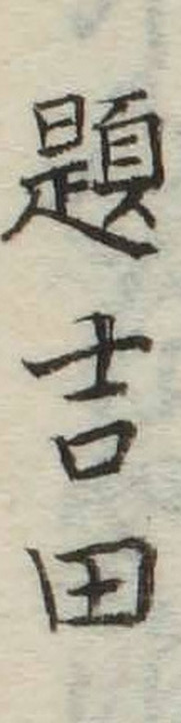題吉田
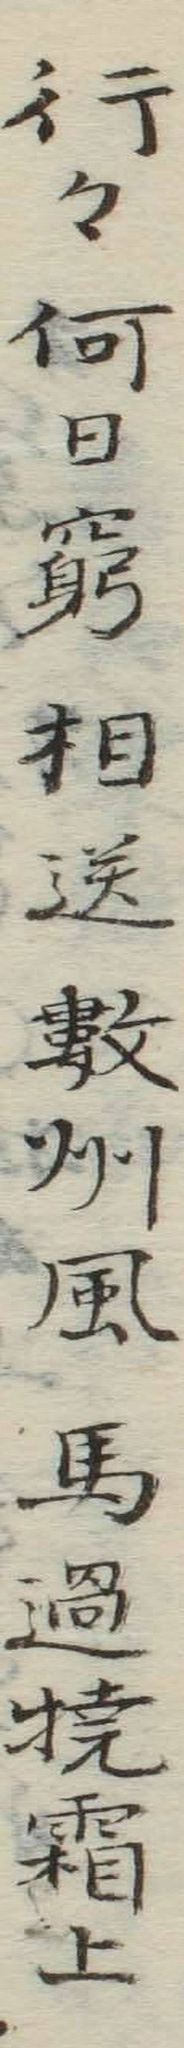行々何日窮相送数州風馬過暁霜上
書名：三河国二葉松
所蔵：国文学研究資料館
